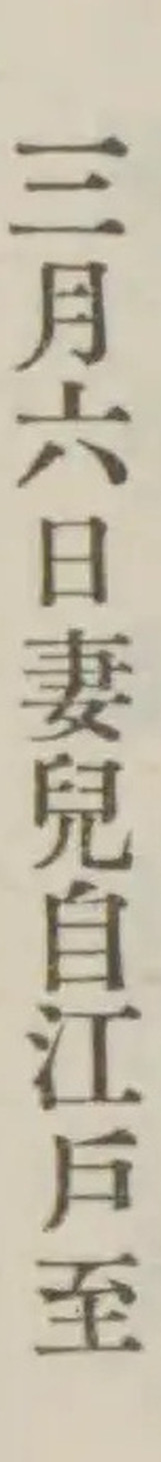三月六日妻兒自江戸至
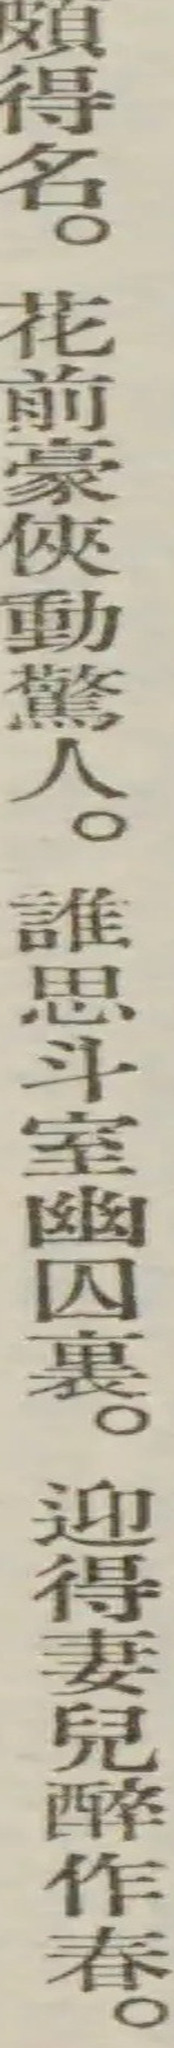廿歳吟壇頗得名。花前豪侠動驚人。誰思斗室幽囚裏。迎得妻兒醉作春。
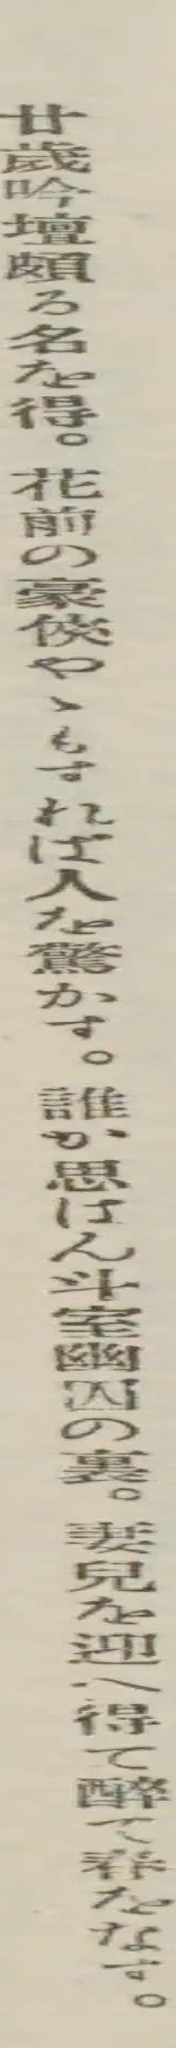廿歳吟壇頗る名を得。花前の豪侠やゝもすれば人を驚かす。誰か思はん斗室幽囚の裏。妻兒を迎へ得て春をなす。
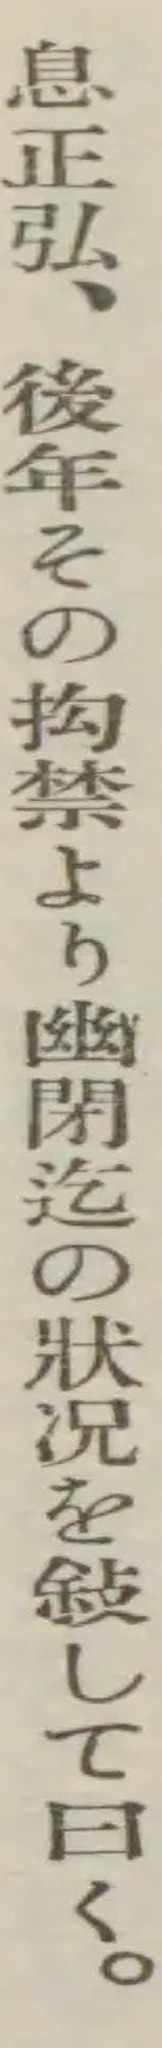息正弘、後年その拘禁より幽閉迄の状況を敍して曰く。
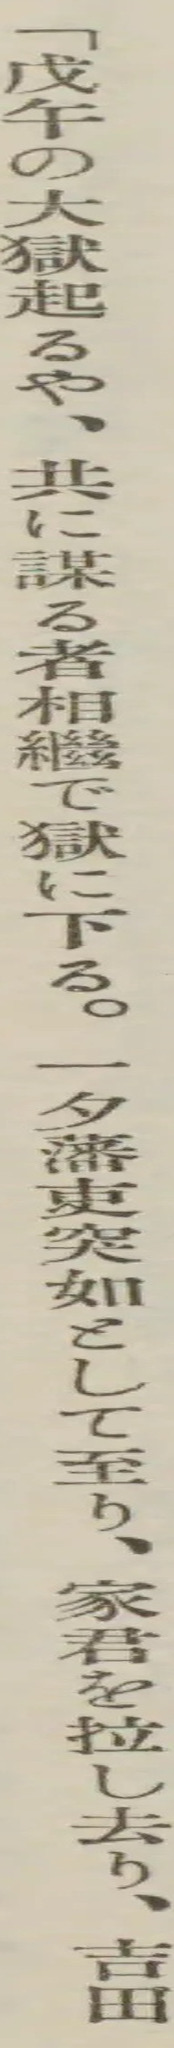「戊午の大獄起るや、共に謀る者相継で獄に下る。一夕藩吏突如として至り、家君を拉し去り、吉田
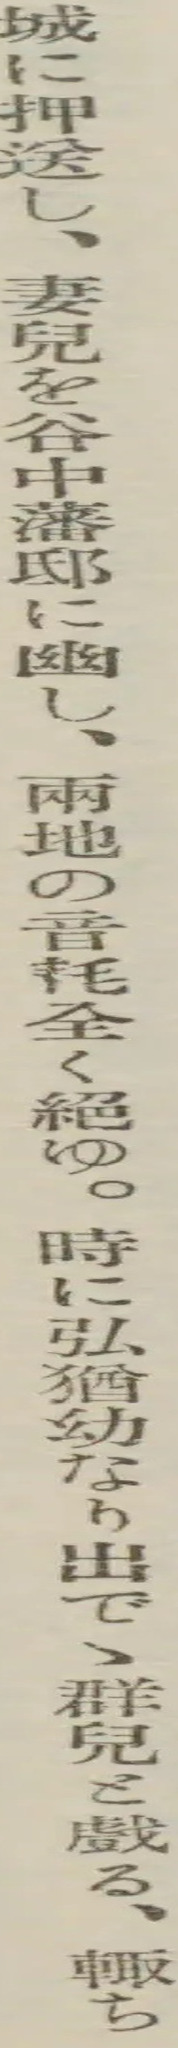城に押送し、妻兒を谷中藩邸に幽し、両地の音耗全く絶ゆ。時に弘猶幼なり出でゝ群兒と戯る、輙ち
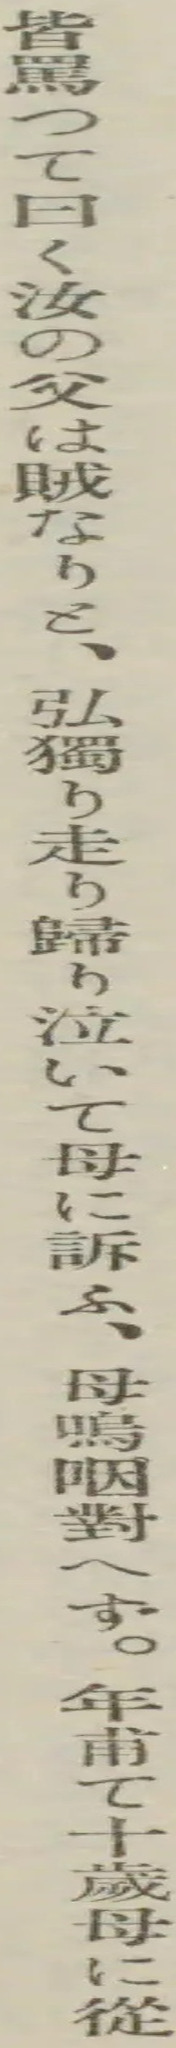皆罵つて曰く汝の父は賊なりと、弘独り走り帰り泣いて母に訴ふ、母嗚咽対へず。年甫て十歳母に従
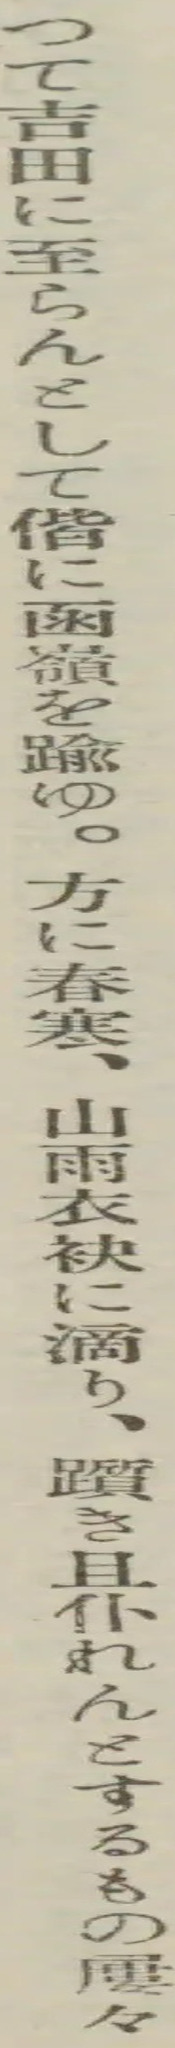つて吉田に至らんとして偕に函嶺を踰ゆ。方に春寒、山雨衣袂に滴り、躓き且仆れんとするもの屡々
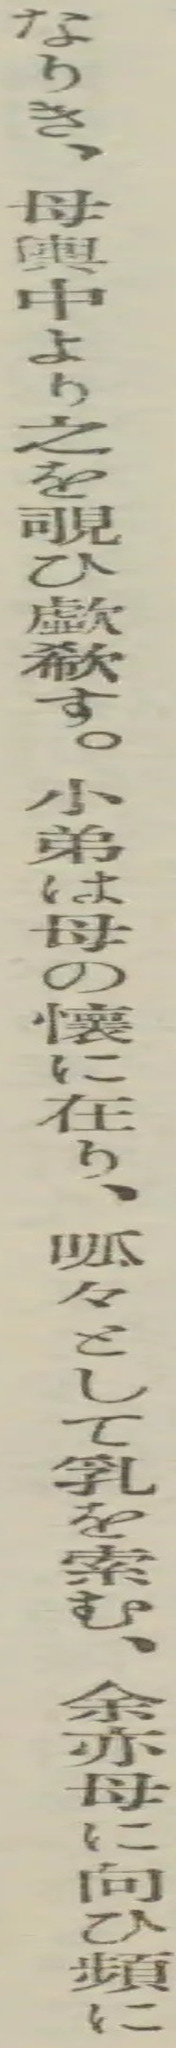なりき、母輿中より之を覗ひ歔欷す。小弟は母の懐に在り、呱々として乳を索む、余亦母に向ひ頻に
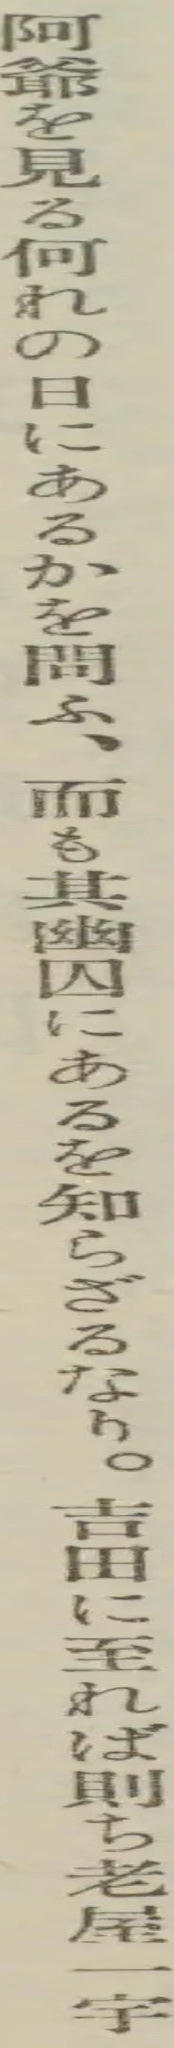阿爺を見る何れの日にあるかを問ふ、而も其幽囚にあるを知らざるなり。吉田に至れば則ち老屋一宇
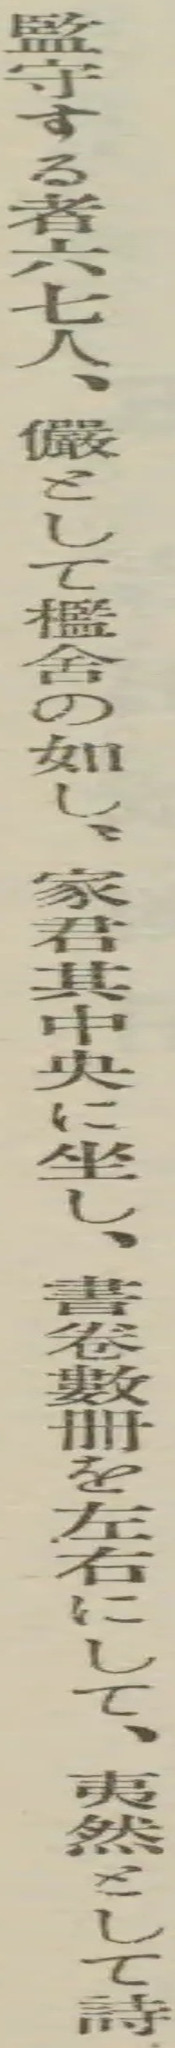監守する者六七人、儼として檻舎の如し、家君其中央に坐し、書巻数冊を左右にして、夷然として詩
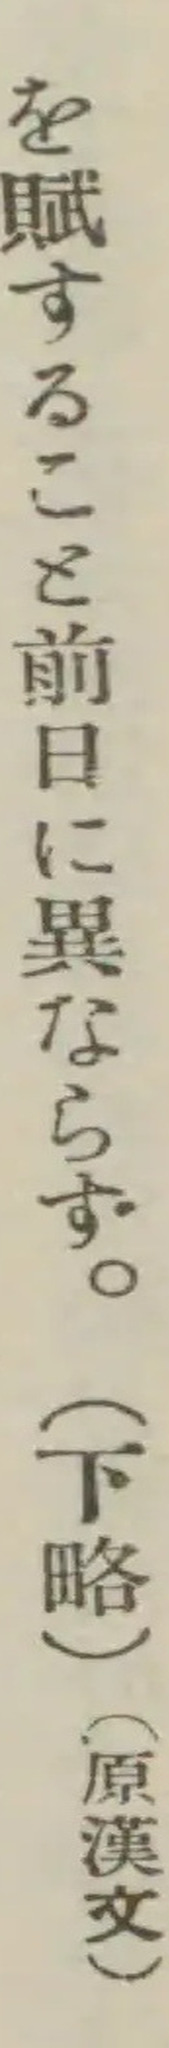を賦すること前日に異ならず。(下略)(原漢文)
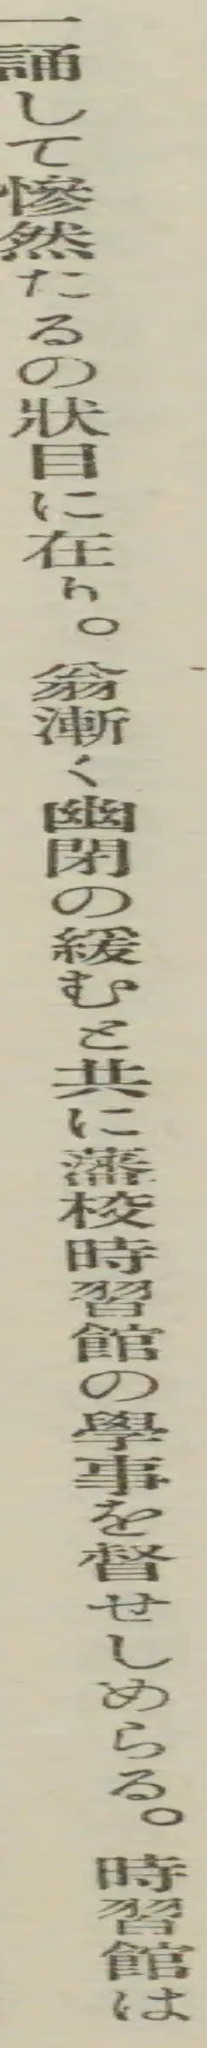一誦して惨然たるの状目に在り。翁漸く幽閉の緩むと共に藩校時習館の学事を督せしめらる。時習館は
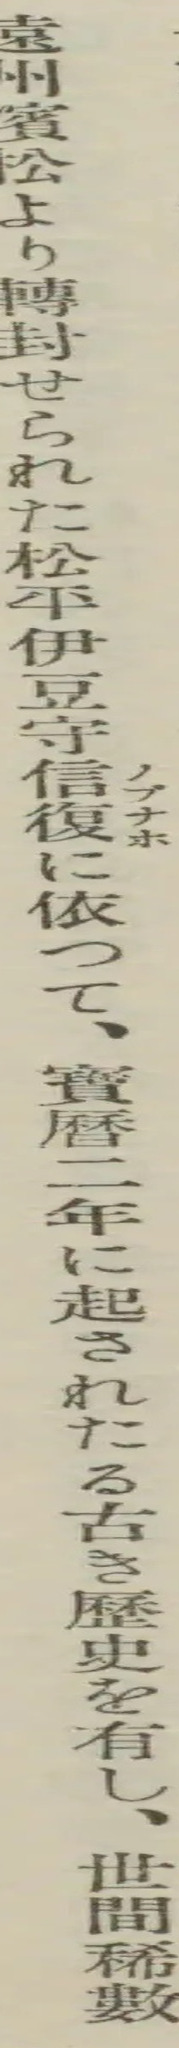遠州濱松より転封せられた松平伊豆守信復に依つて、宝暦二年に起されたる古き歴史を有し、世間稀数
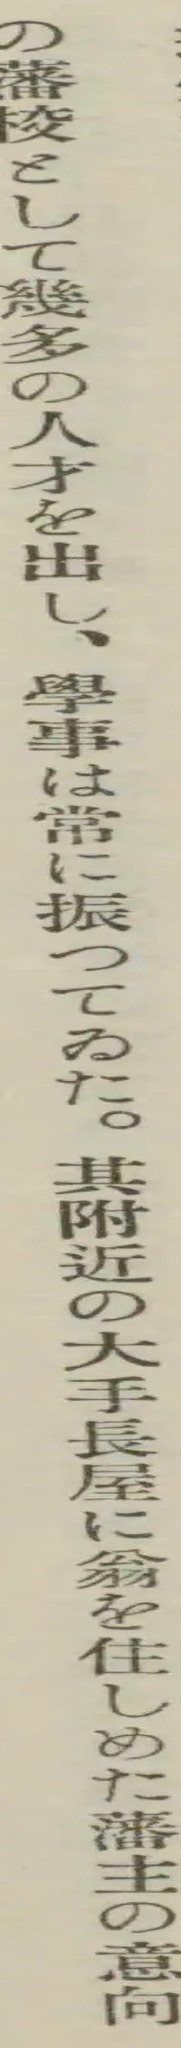の藩校として幾多の人才を出し、学事は常に振つてゐた。其附近の大手長屋に翁を住しめた藩主の意向
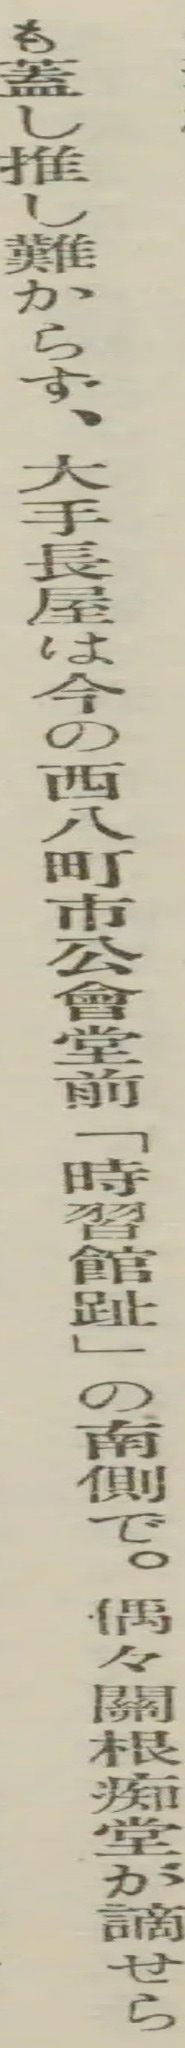も蓋し推し難からず、大手長屋は今の西八町市公会堂前「時習館趾」の南側で偶々關根痴堂が謫せら
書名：小野湖山翁小伝
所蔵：国立国会図書館 National Diet Library, JAPAN
